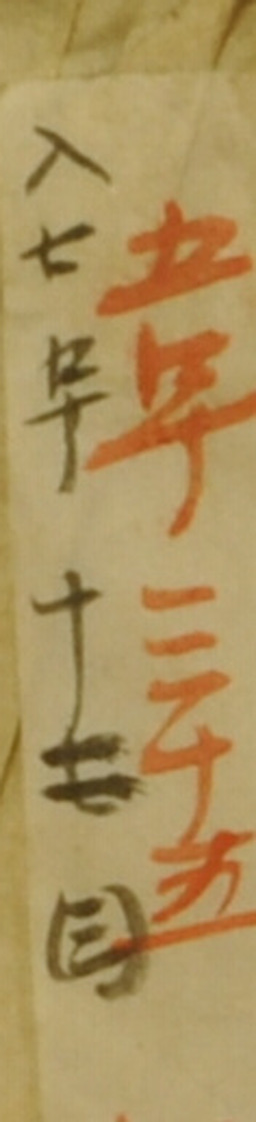入七号十二(三)
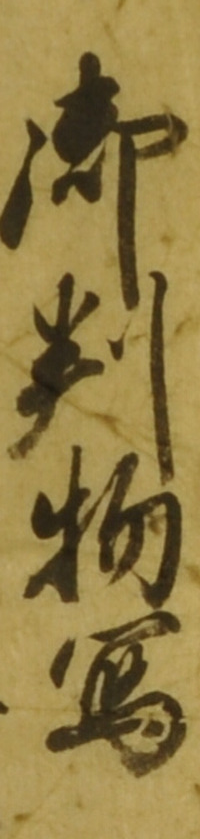御判物写
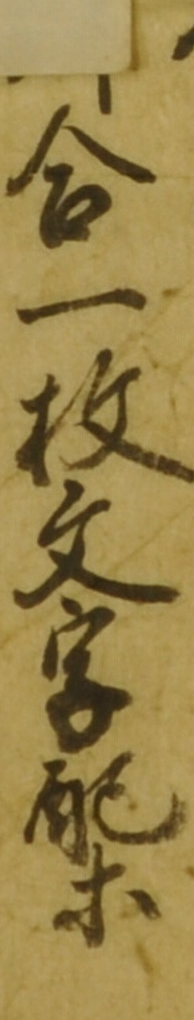合一枚文字配等
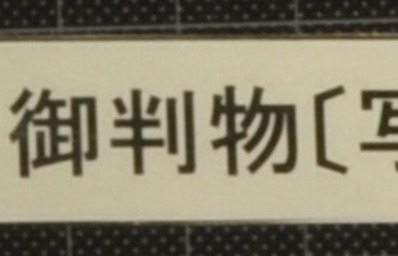御判物

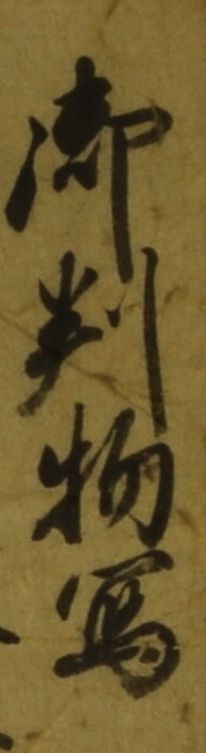御判物写
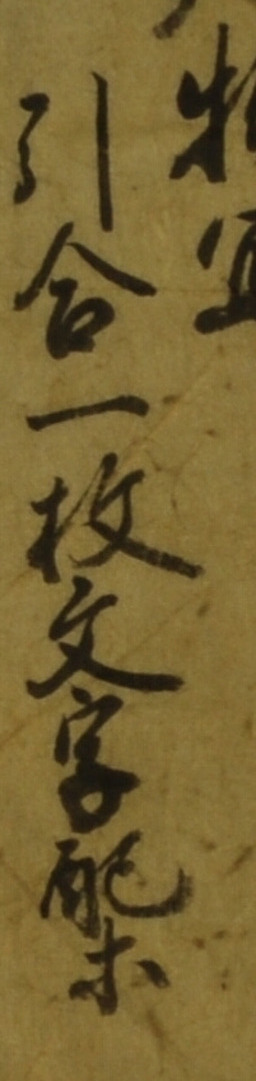引合一枚文字配等
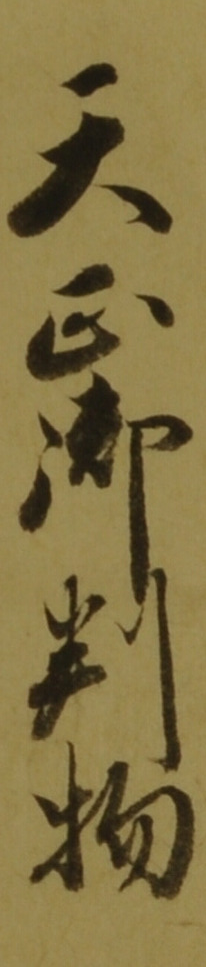天正御判物

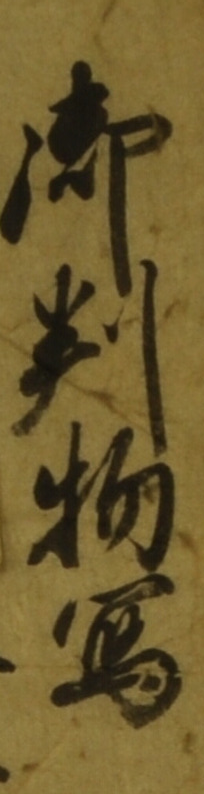御判物寫
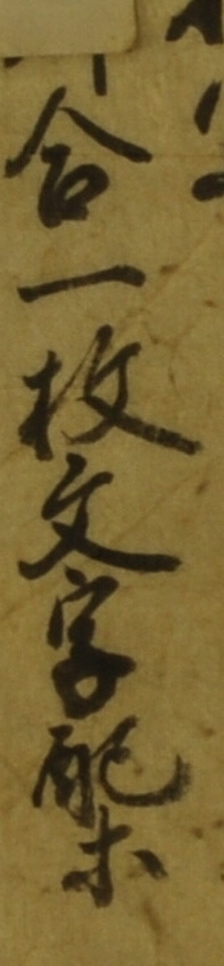合一枚文字配等
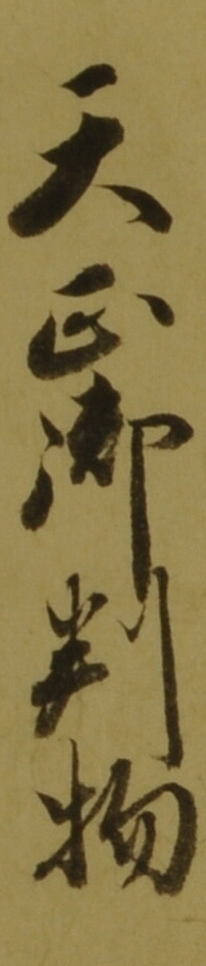天正御判物

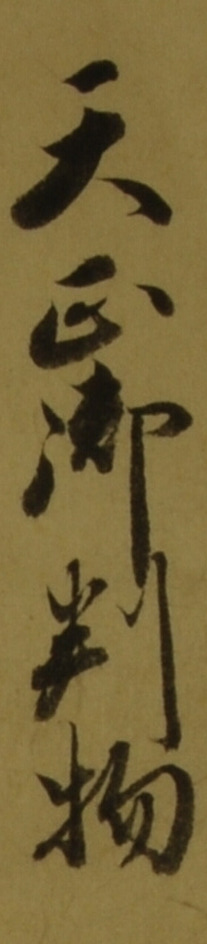天正御判物

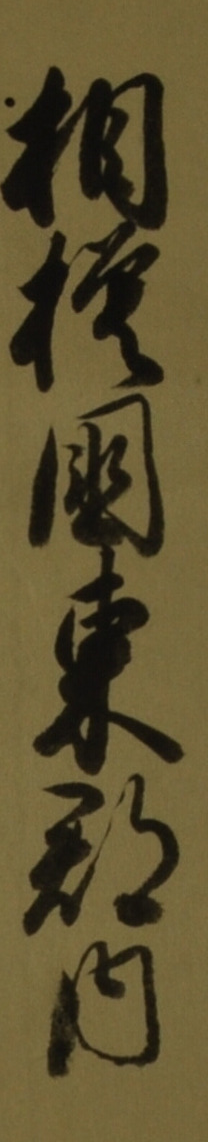相模国東郡内
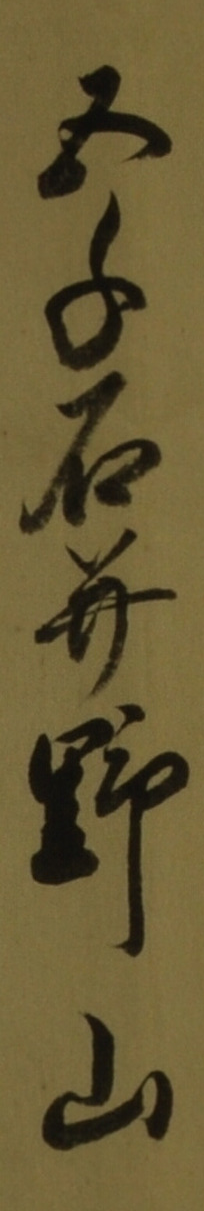五千石幷野山
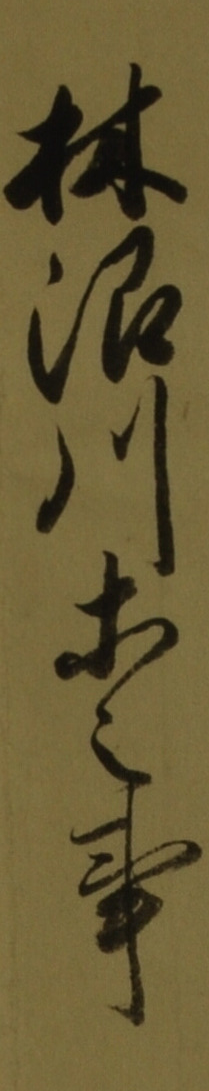林沼川等之事
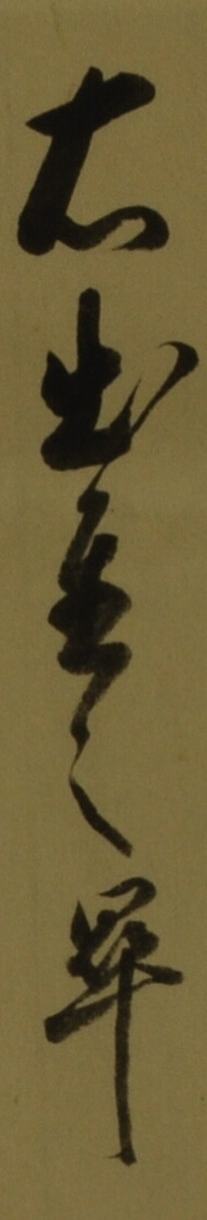右出置之畢
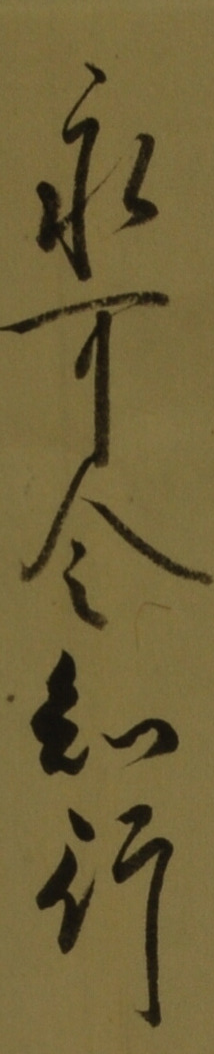永可令知行
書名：御判物〔写〕
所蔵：伊那市立高遠町図書館・合同会社AMANE
